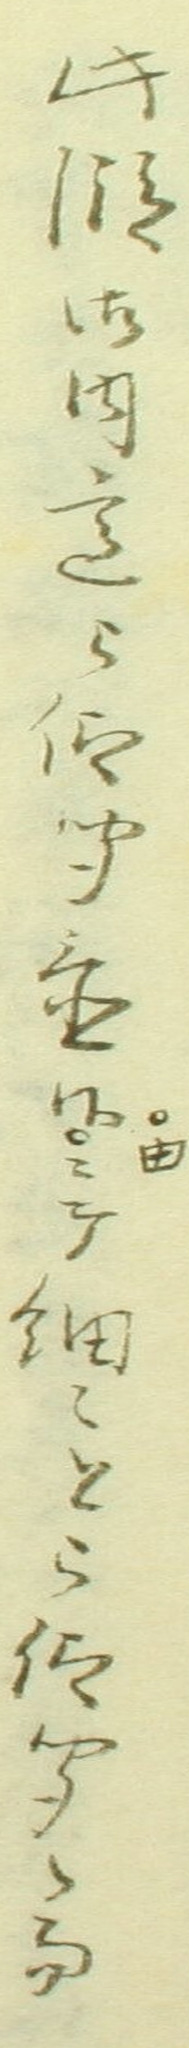此段御内迠被仰聞置候由にて細々と被仰聞候事
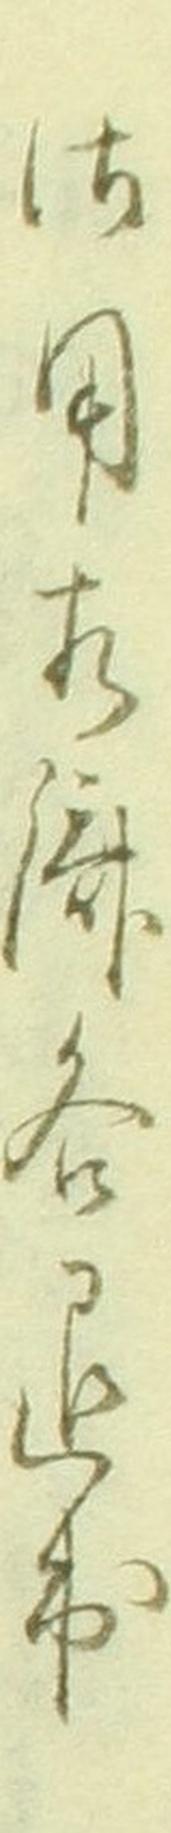御用相済各退来
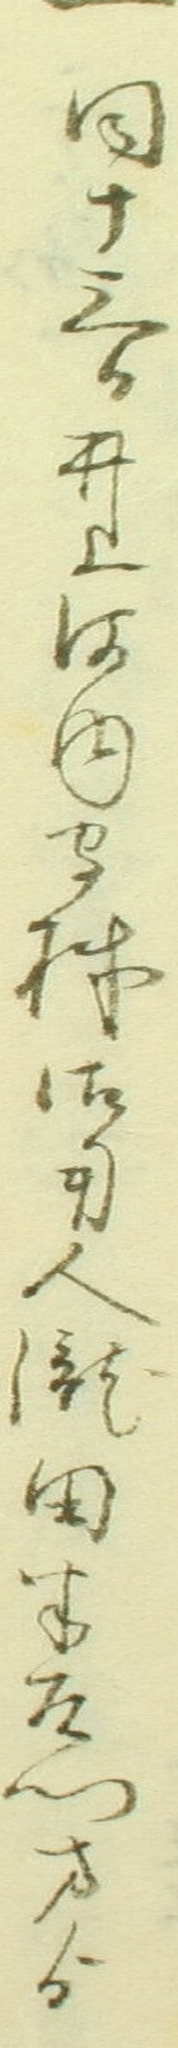一同十三日井上河内守様御用人滝田半左衛門方ゟ
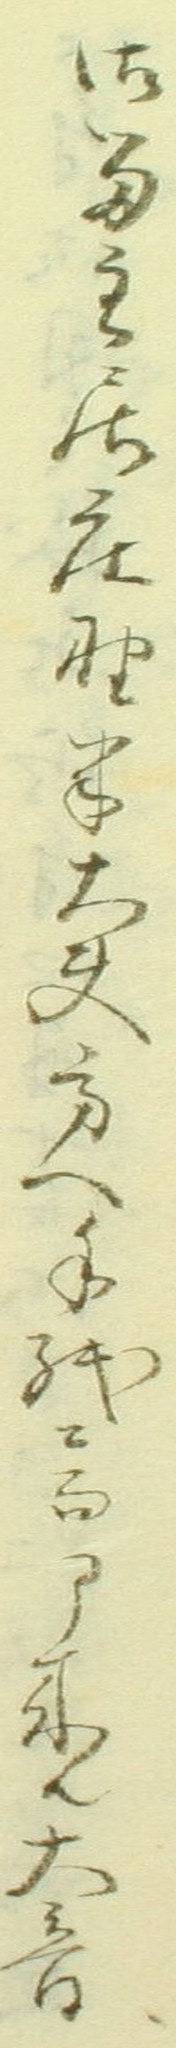御当主に御庄野半太夫方へ手紙に而申来る大音
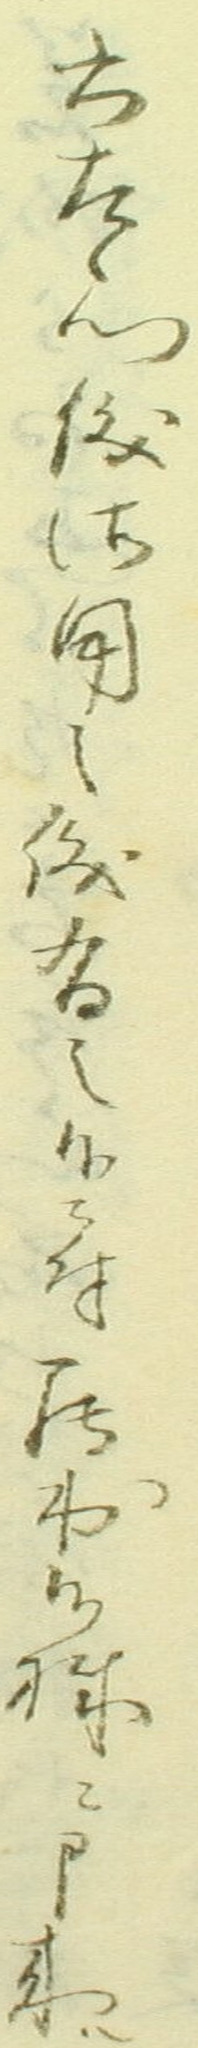六左衛門儀御用の儀有之候に付罷出候様に申来る
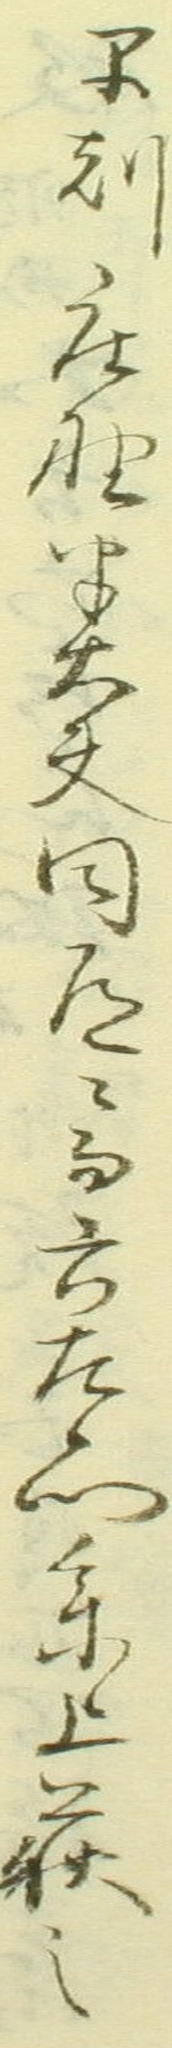早刻庄野半太夫同道に而六左衛門参上萩之
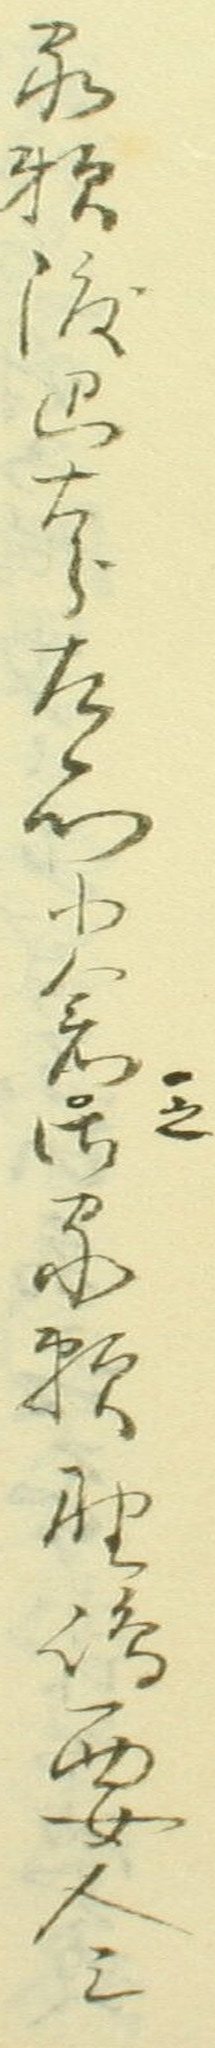家頼渡辺？郎左衛門小倉之御家頼野嶋要人三
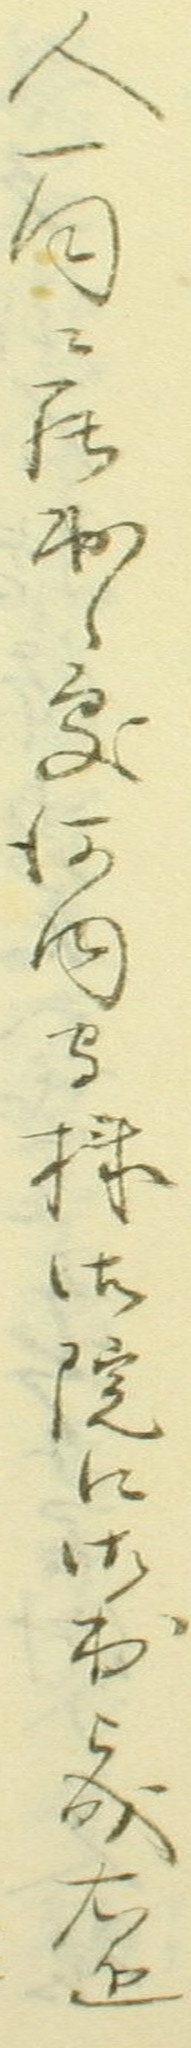人一同に罷出候處河内守様御院に御出被成右迠
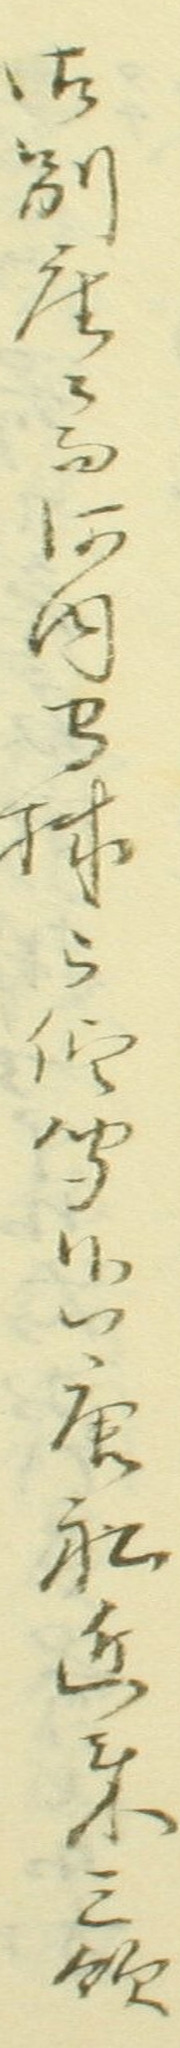御別座に而河内守様被仰聞候は唐船近来三領
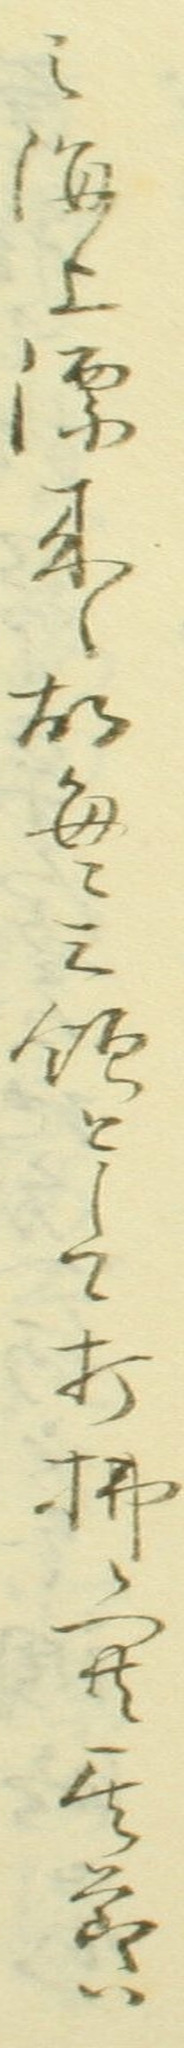之海上漂来し故毎々三領として打払払つ共其節は
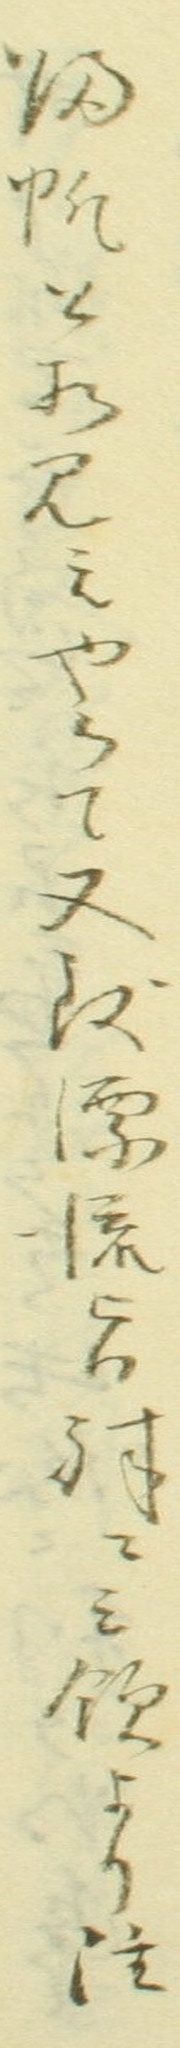帰帆と相見えやかて又致漂流旨殊に三領より注
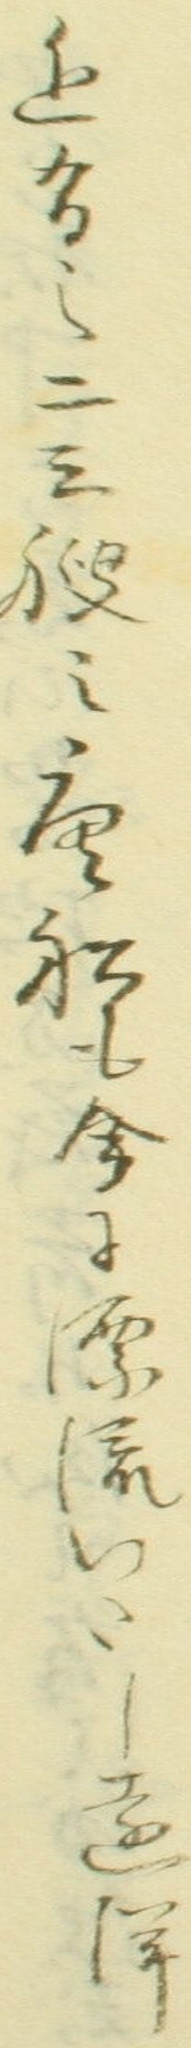進有之二三艘之唐船も今に漂流いたし遠洋
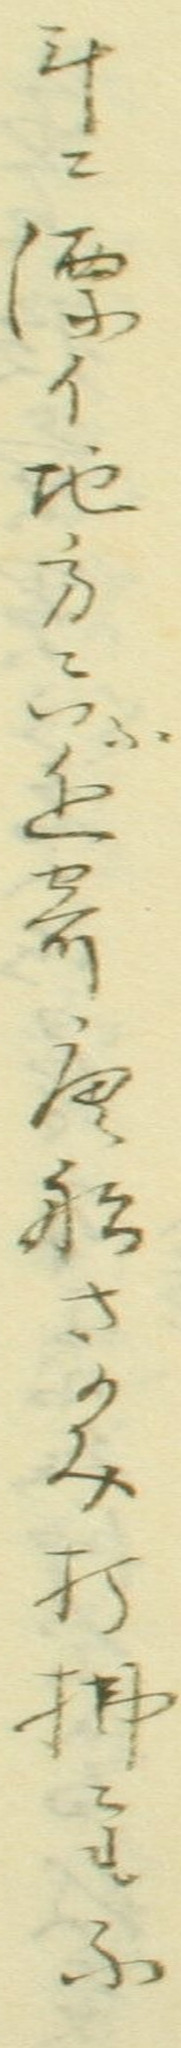斗に漂い地方にいふ近寄唐船さのみ打払にも不
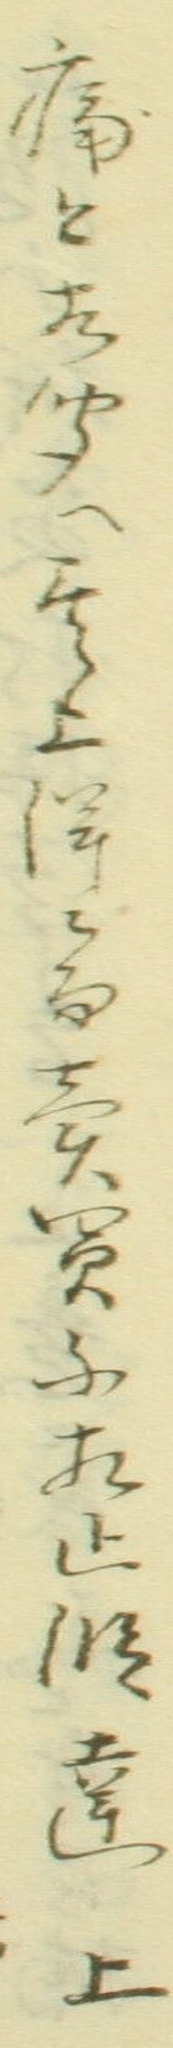痛と相聞へ其上洋に而売買不相止段達上
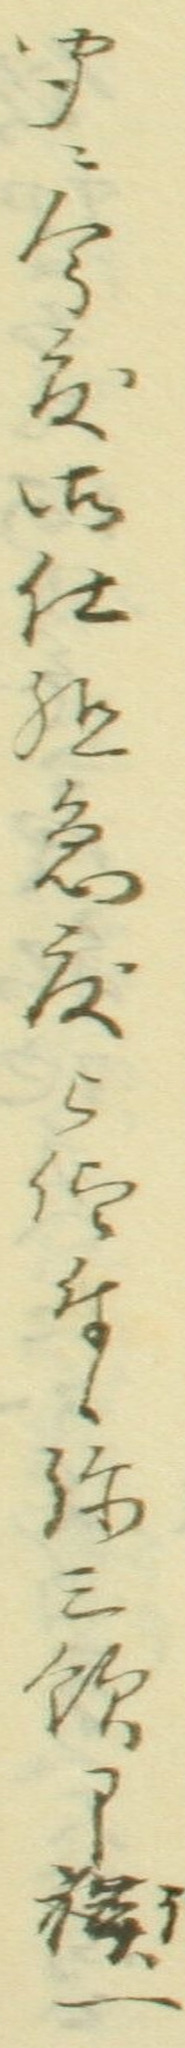聞に今度御仕組急度被仰付候弥三領申？詰一

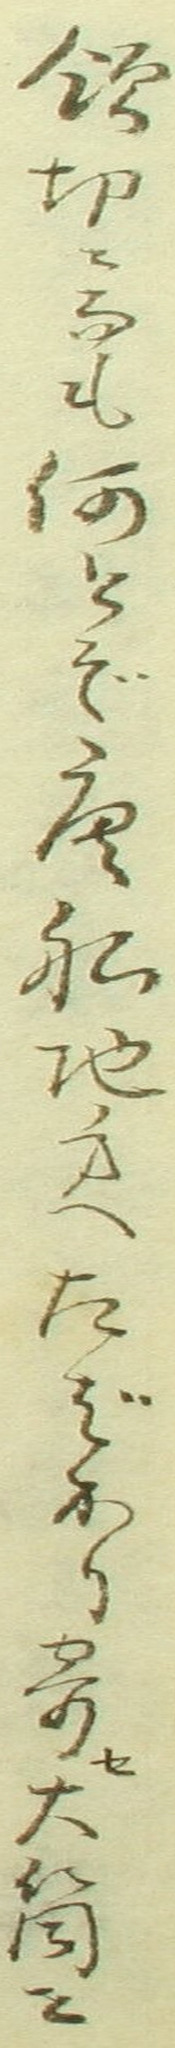領切に而も何とぞ唐船地方へたば？り寄せ大筒を
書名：唐船漂流記 四
